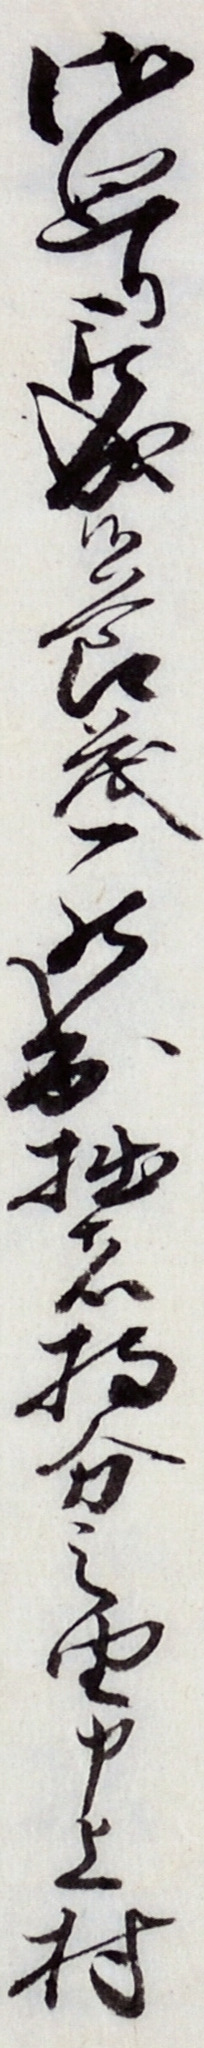御廻り被成候節も罷出拙者持分之由申上村
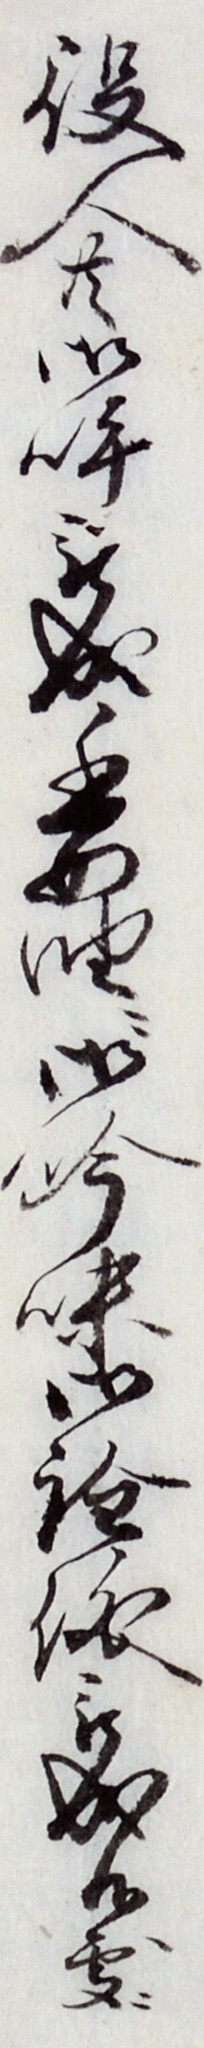役人共御呼被成委細ニ御吟味御詮儀被成候処ニ
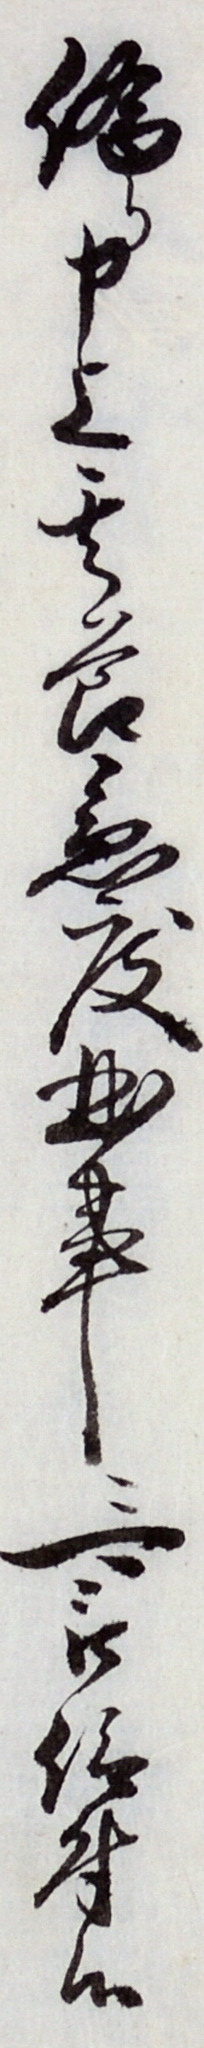偽り申上其節急度曲事ニ可被仰付候
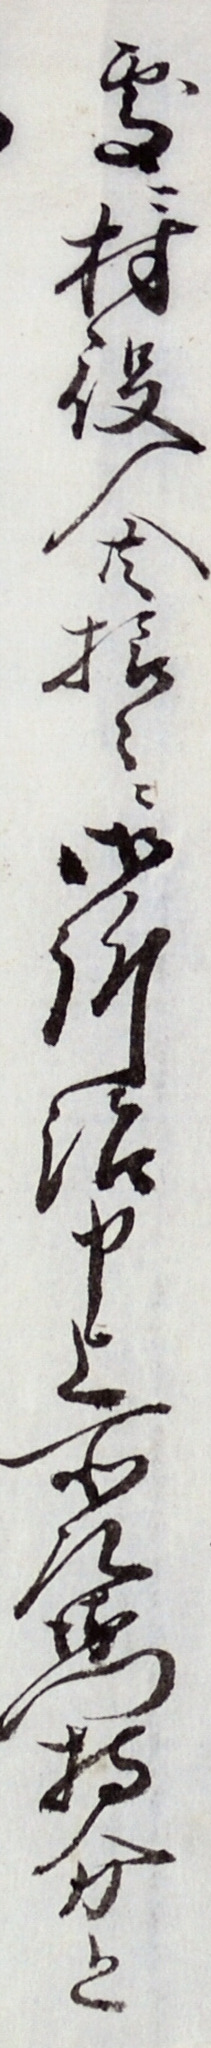処ニ村役人共様々ニ御訴訴治申上所左衛門持分と
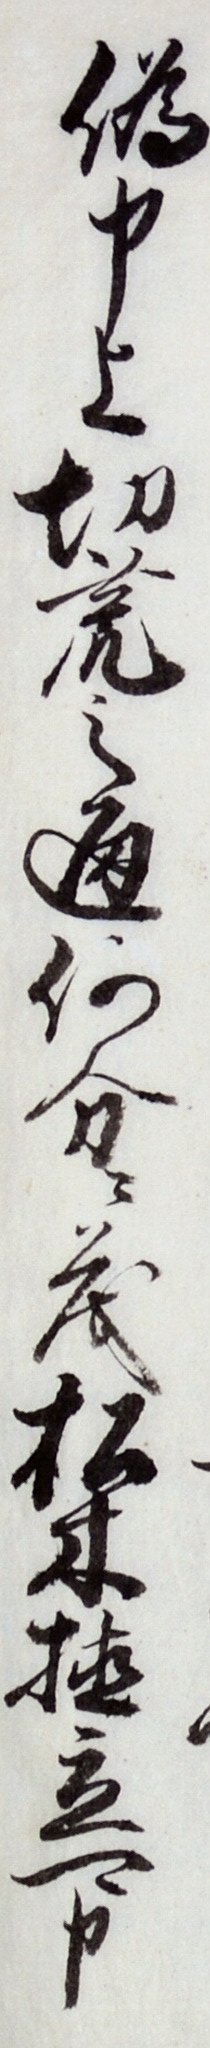偽申上切荒之通何分ニも松木植立可申

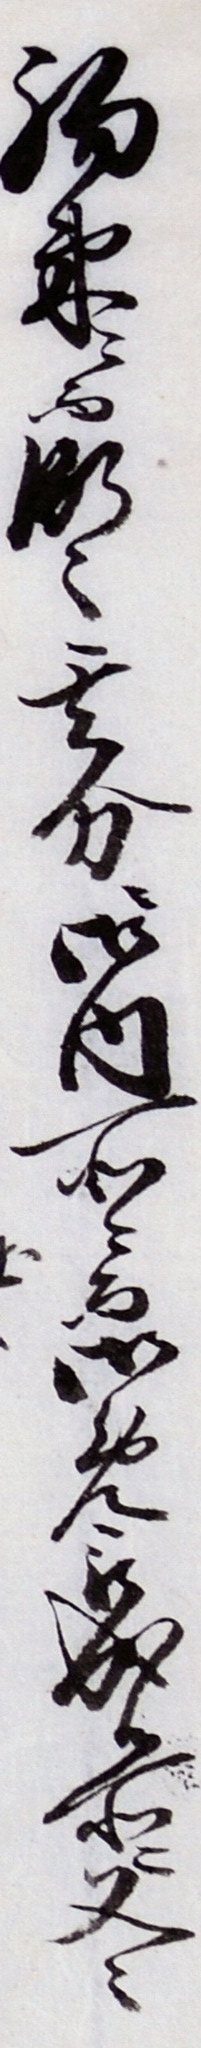約束ニ而明々其分ニ御内所ニ而御免被成候所ニ又々
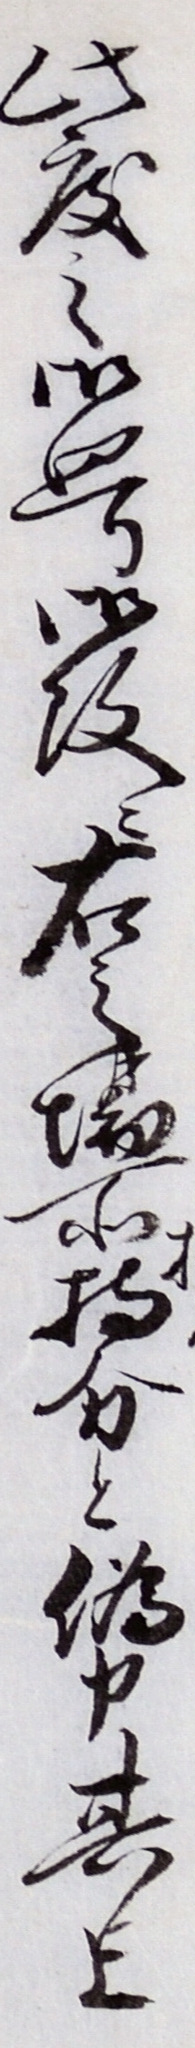此度之御廻り御改ニ右之場所拙者持分と偽申其上
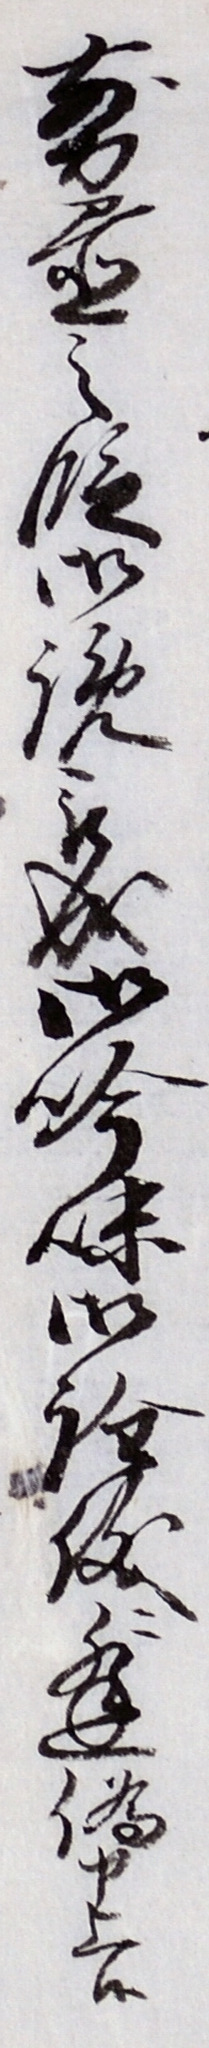剪置之段御覧被成御吟味御詮儀ニ逢偽申上候
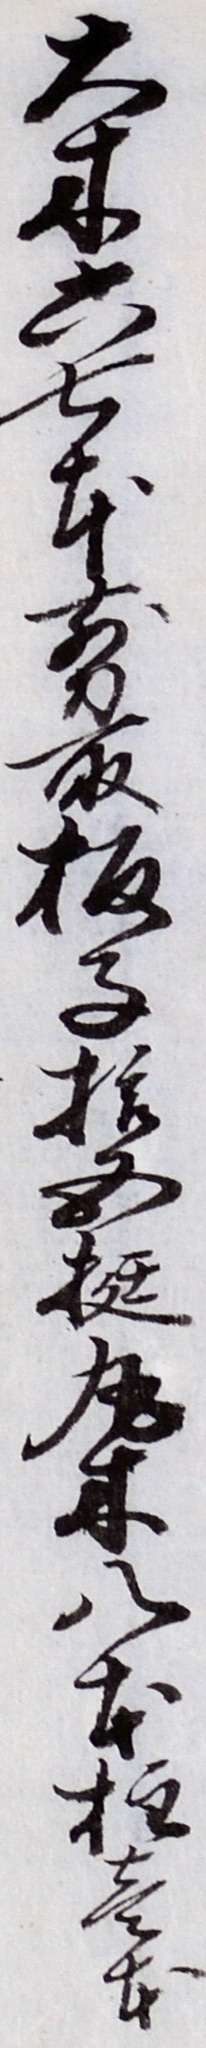大木六七本剪取板子拾五挺丸木八本柱壱本
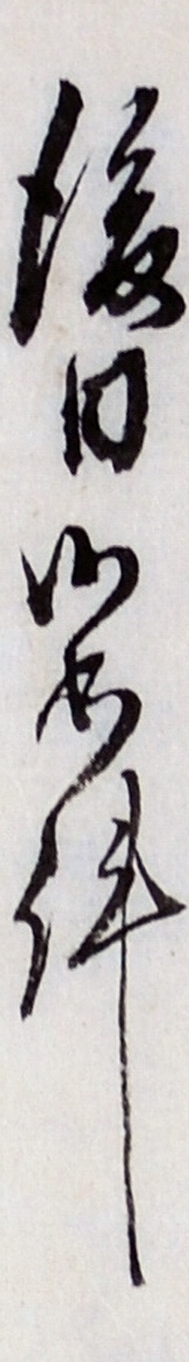後日候如件
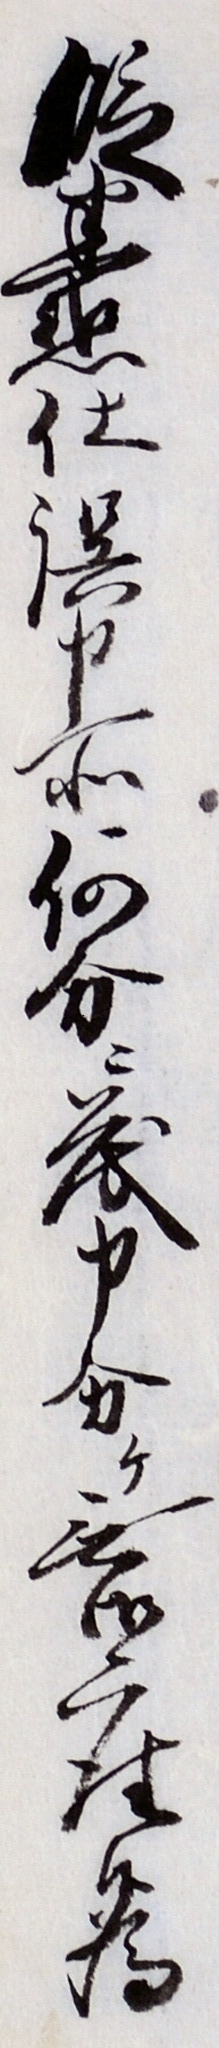段迷惑仕誤申所何分ニも申分ヶ無御座候為
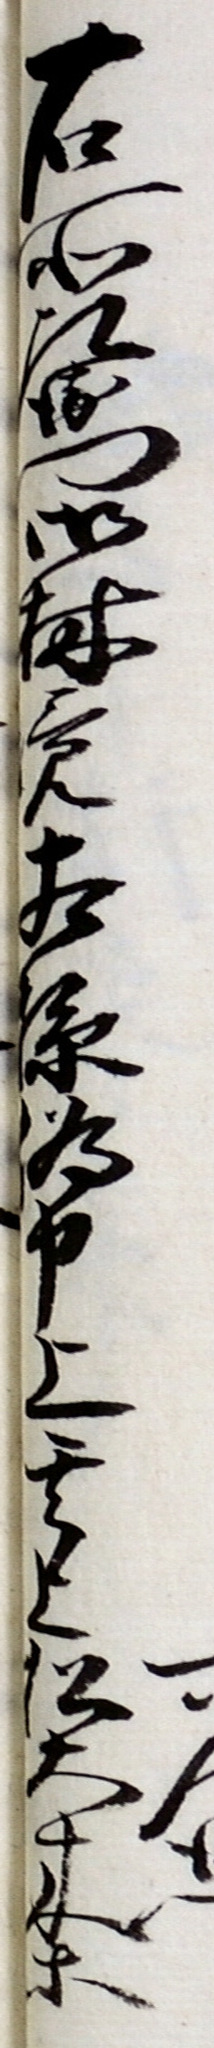右所左衛門御林境相偽申上其上松大木等
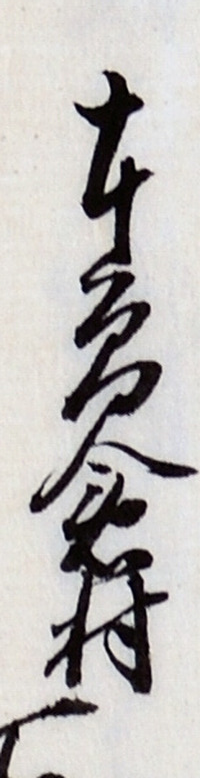本曽倉村
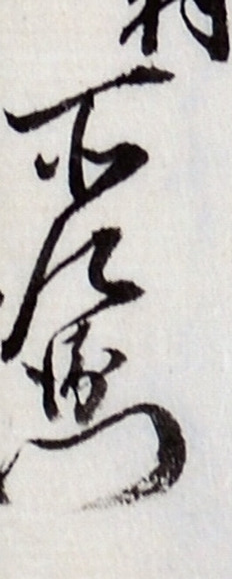所左衛門
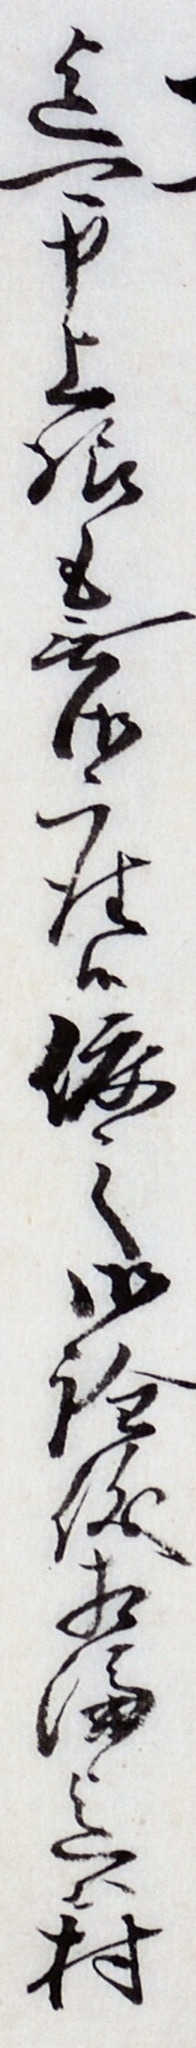迄可申上様も無御座候依之御詮儀相済迄ハ村
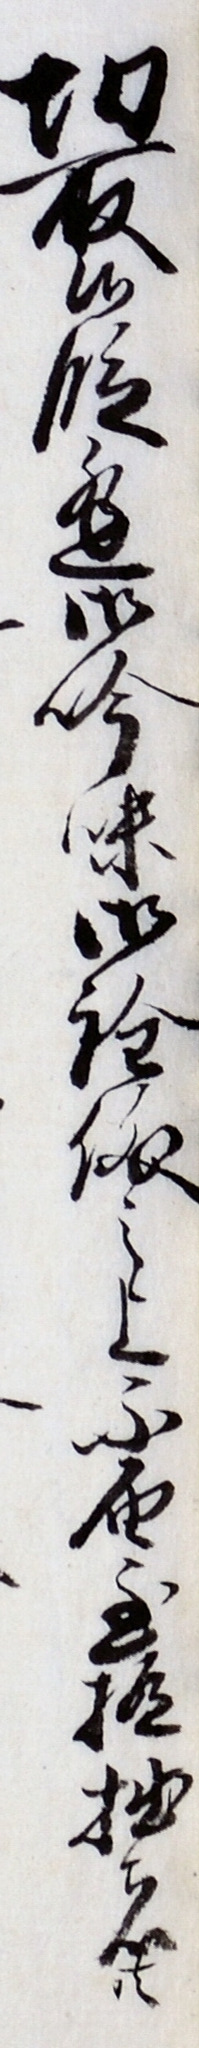切取候段逢御吟味御詮儀之上不届至極拙者共
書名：御林御竹藪証文控
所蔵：伊那市立高遠町図書館・合同会社AMANE
